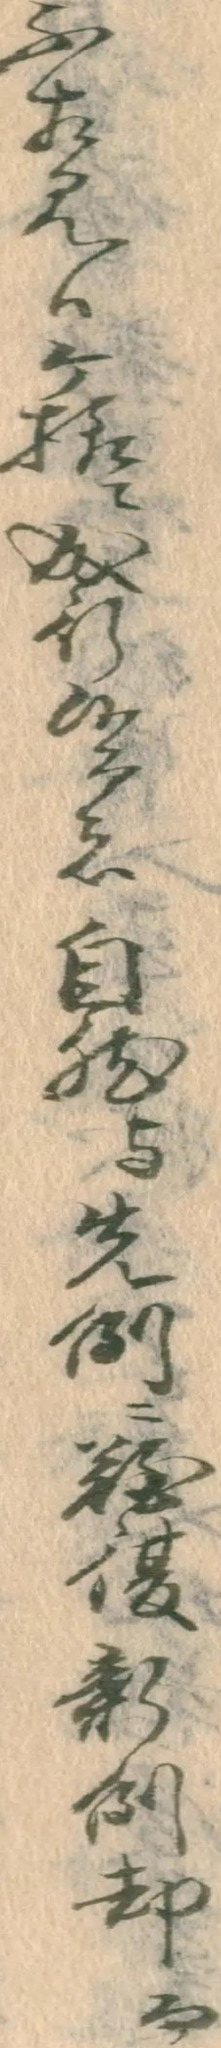不相見候ケ様ニ成行候而は自然与先例ニ難復新例却而
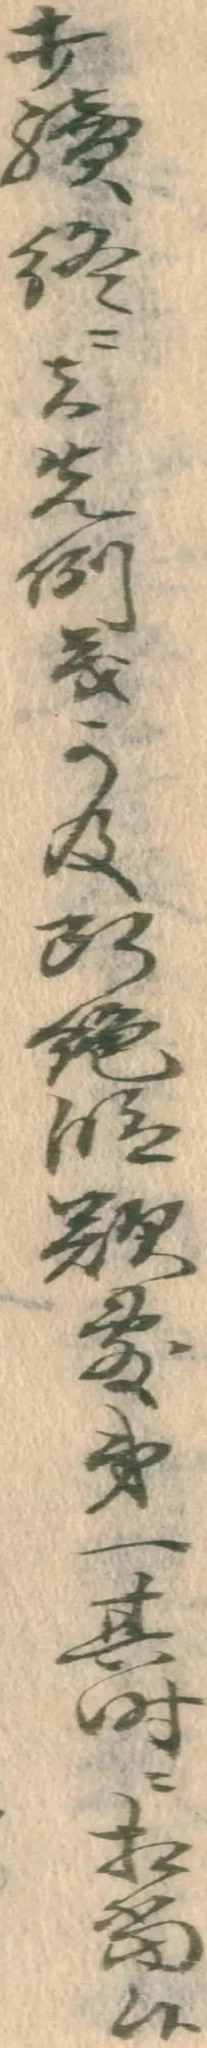打続終ニは先例義可及断絶段歎敷第一其時ニ相当候
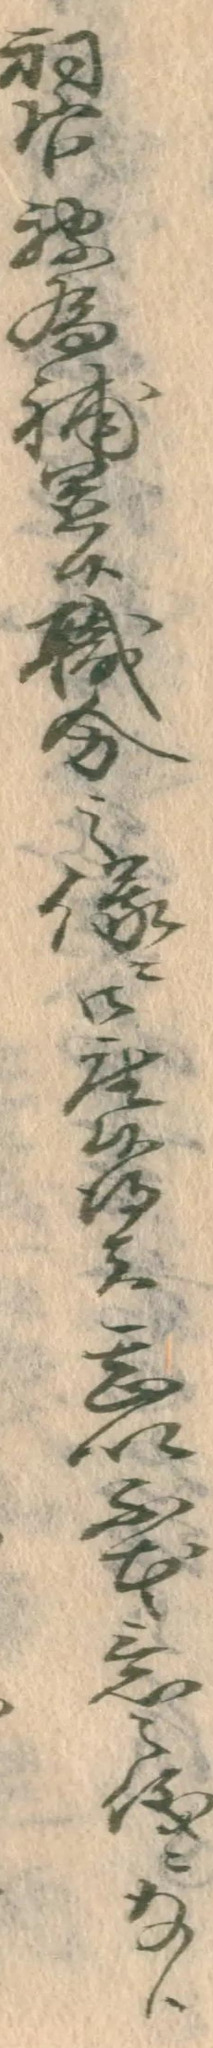祠官被為補置候職分之儀ニ御座候得は甚以不本意之儀ニ存候
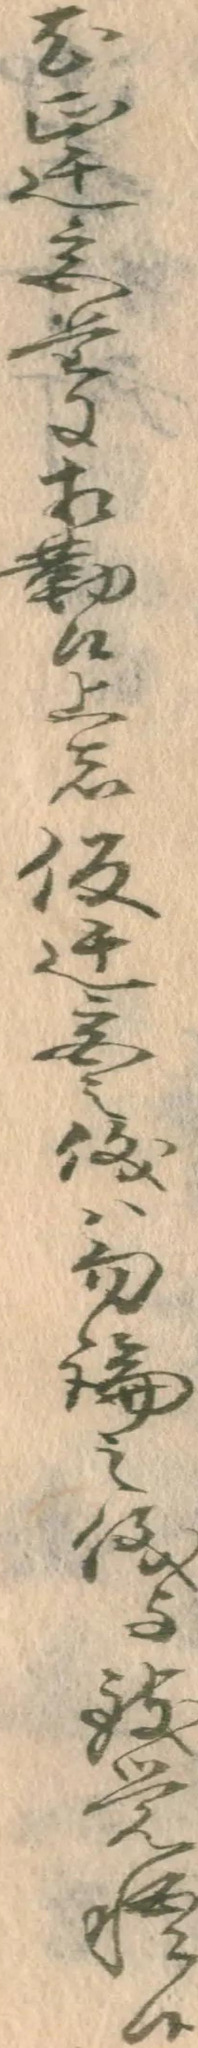尤正迁宮堂に相勤候上は仮迁宮之儀ハ勿論之儀与致覚悟候
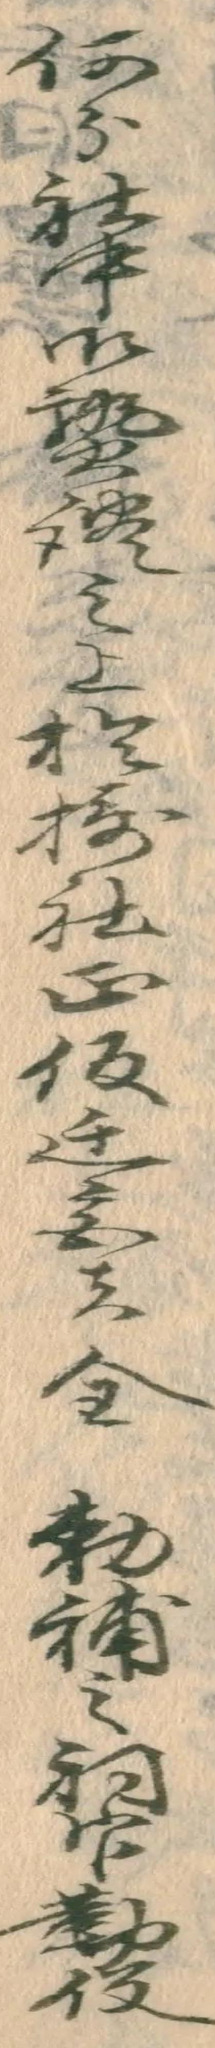何分社中御熟談之上於摂社正仮迁宮は全勅補之祠官勤役
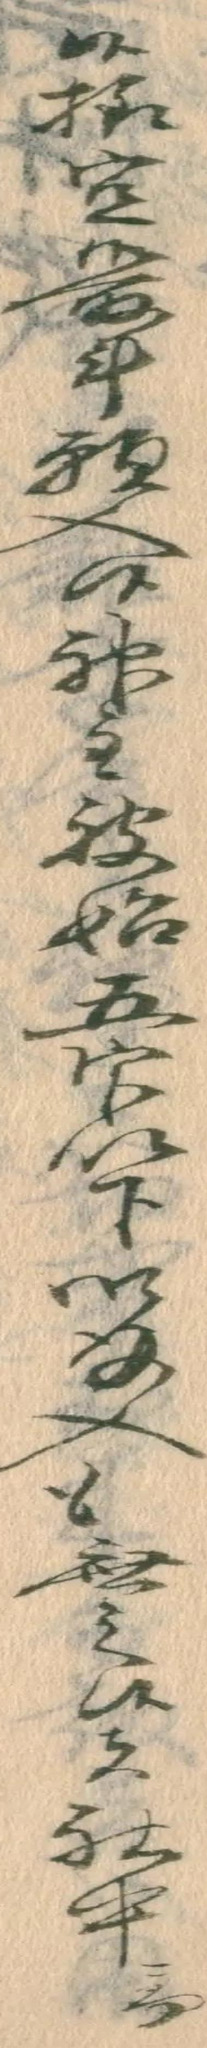候様宜御取計願入候神主被始五官以下御存入も無之候は社中ニ而
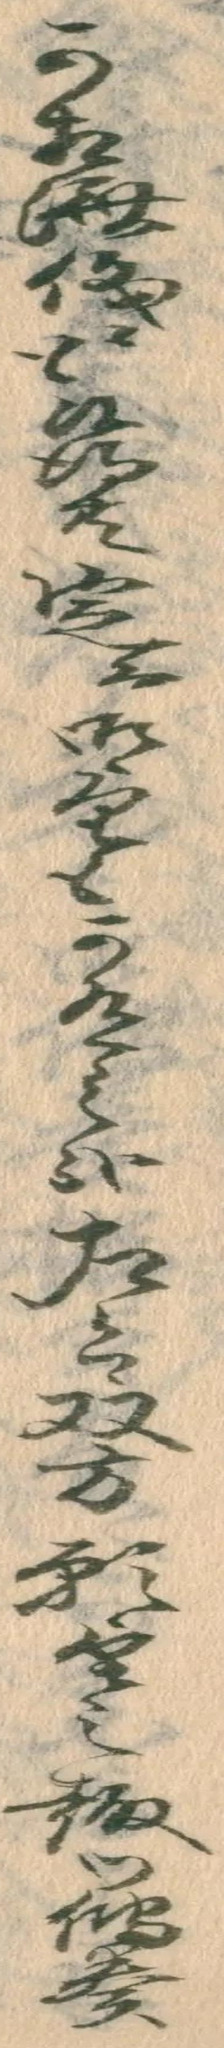可相済儀ニも候得共定而御望も可有之哉左候ハヽ双方願望之趣御伝奏
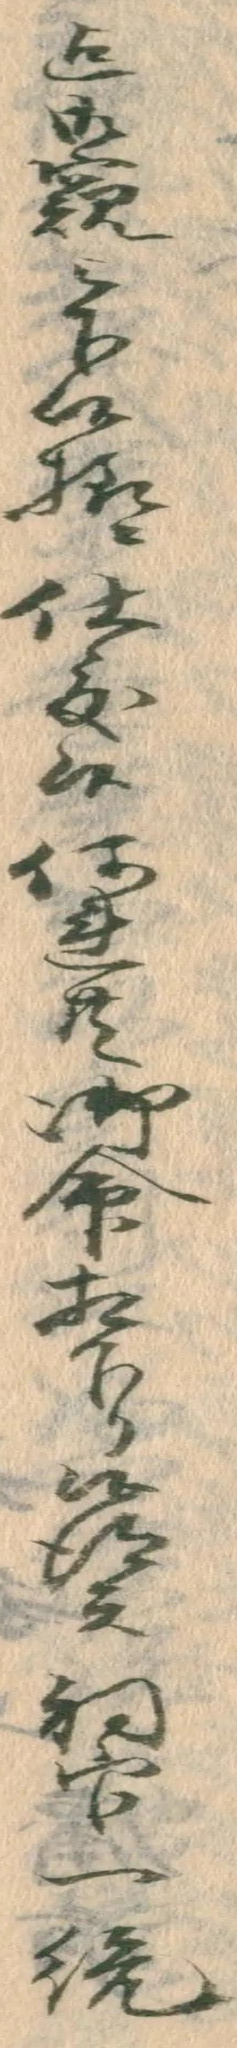迄御窺被下候様ニ仕度候何連共御命相下り候得者祠官一統
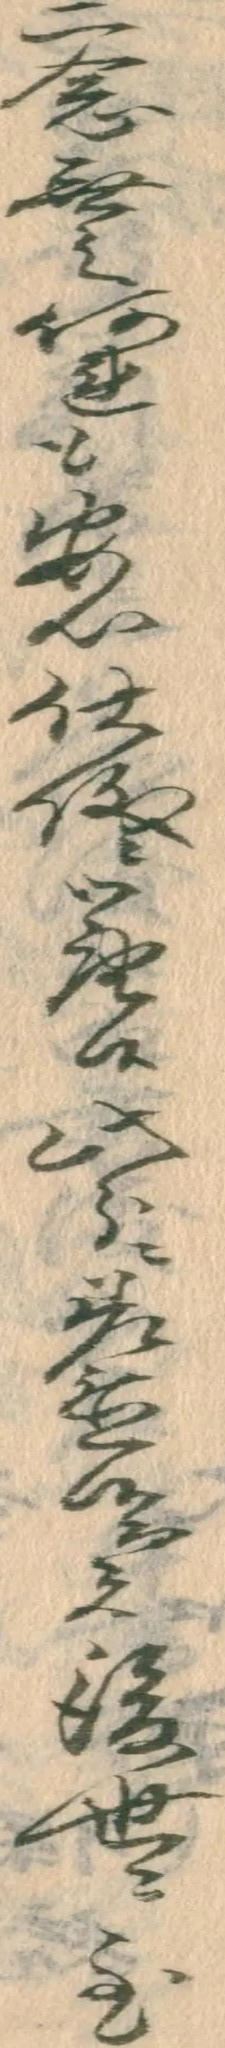二念無之何れも安心仕儀ニ御座候此分ニ差置候而は後世ニ至
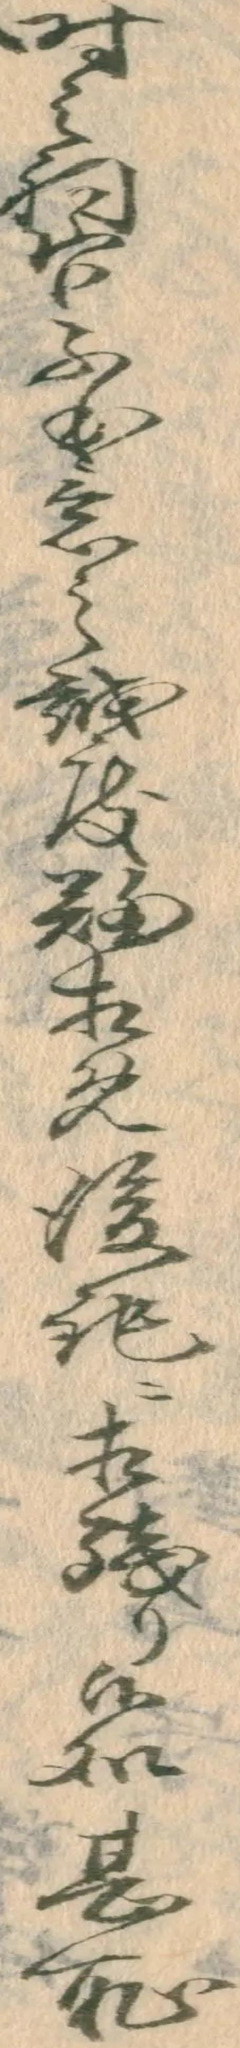時之祠官不本意之越度難相免後記ニ相残り候処甚恥
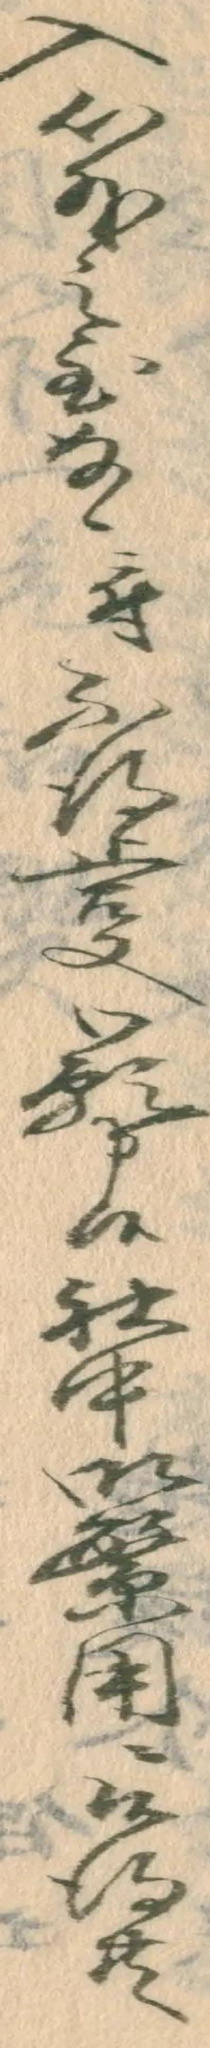入心外之至如候ニ付不得止事御願申候社中御繁用ニ候得共
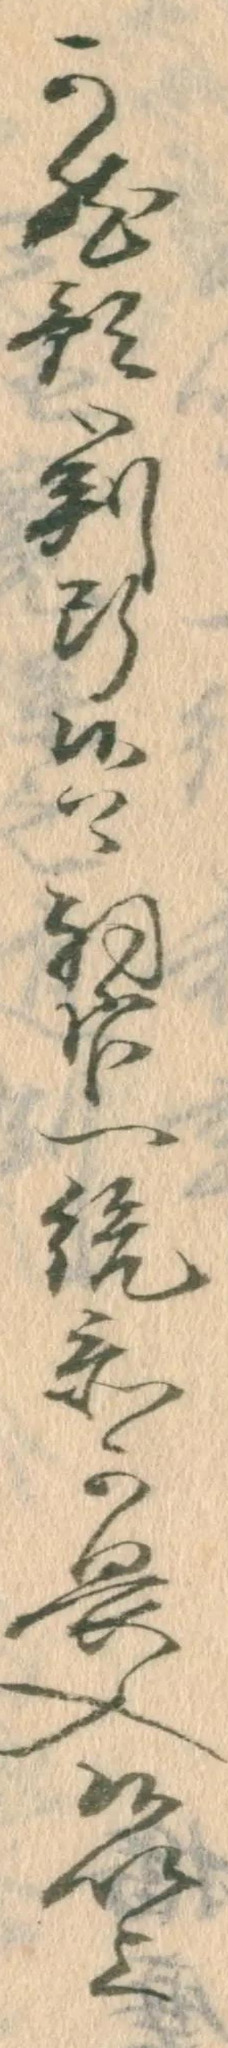可然預御判断候ハヽ祠官一統忝可畏入候以上
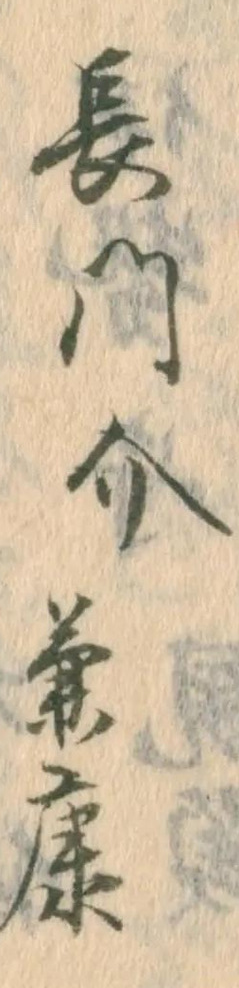長門介兼康
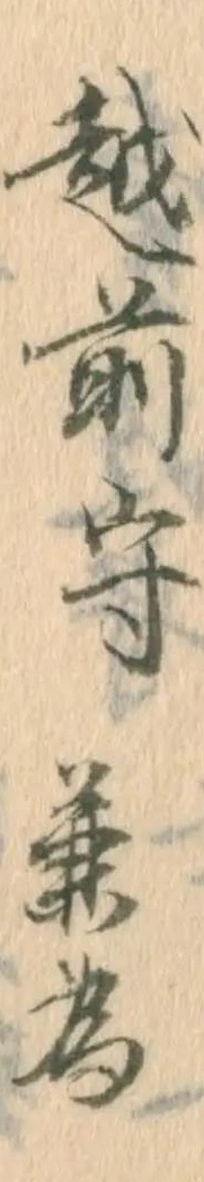越前守兼為
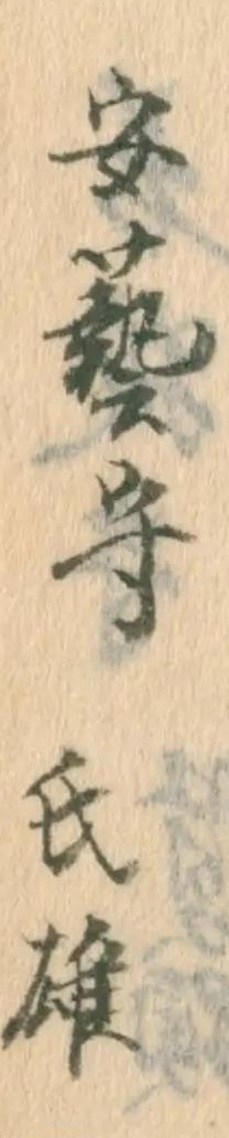安芸守氏雄

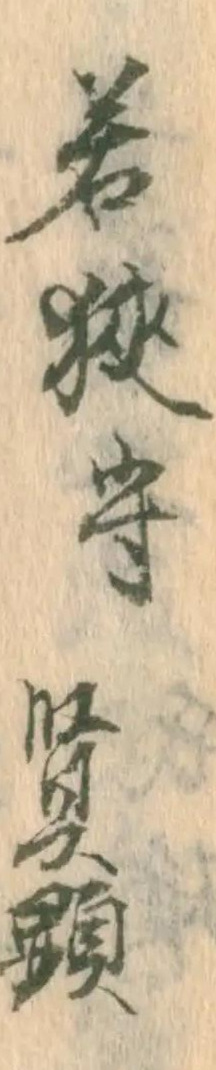若狭守賢顕
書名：賀茂社記録. 第17冊
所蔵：国立国会図書館 National Diet Library, JAPAN
